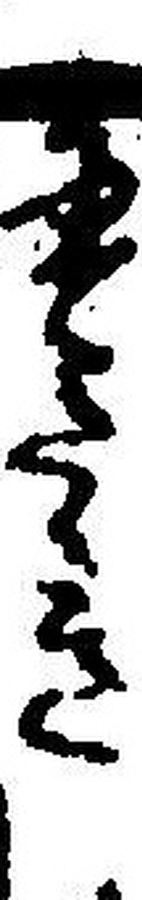にてたゝき
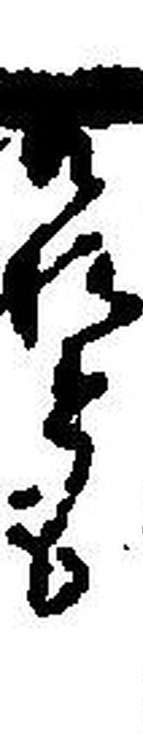けれとも
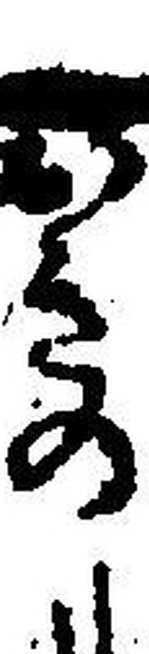おきの
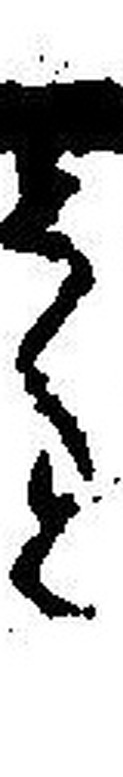とくと
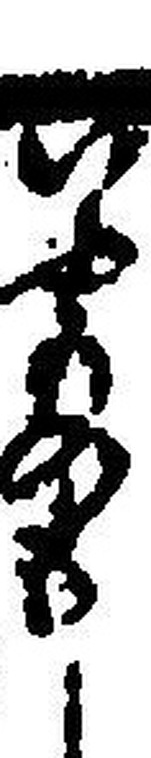いふものも
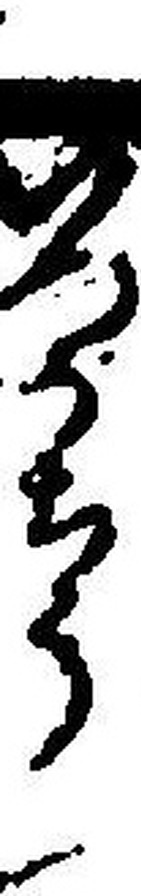いつかちう
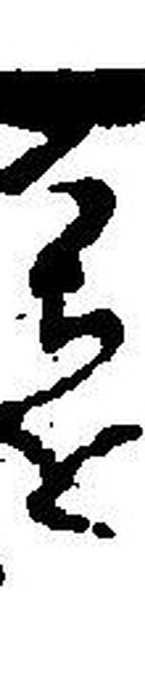くちを
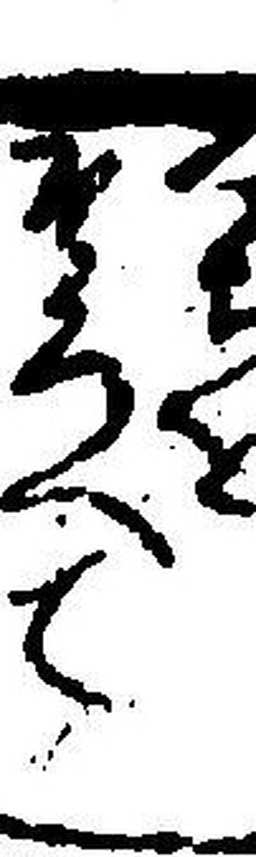そろへて
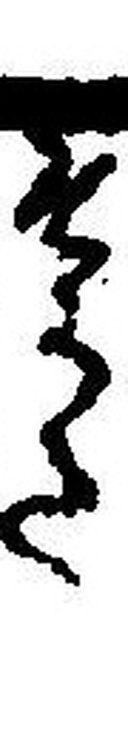そうた
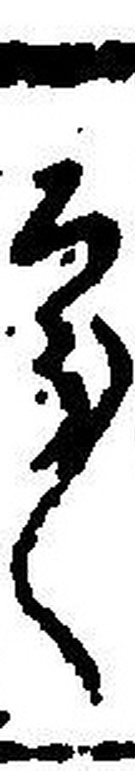ろう〳〵
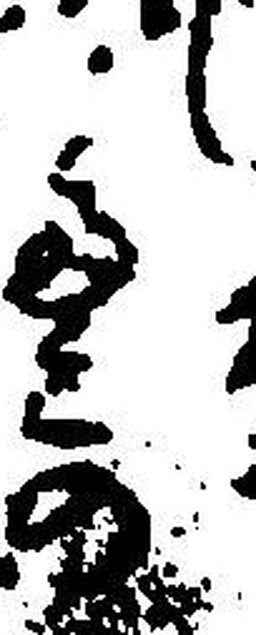たこの
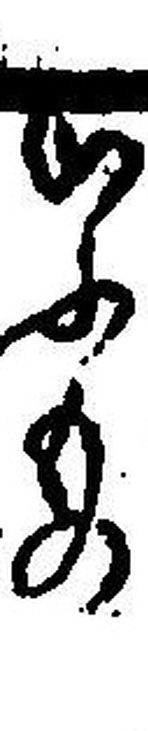いふもの
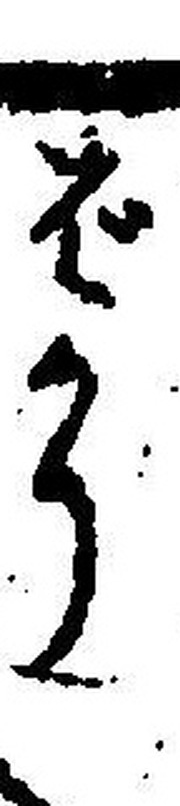ばかり

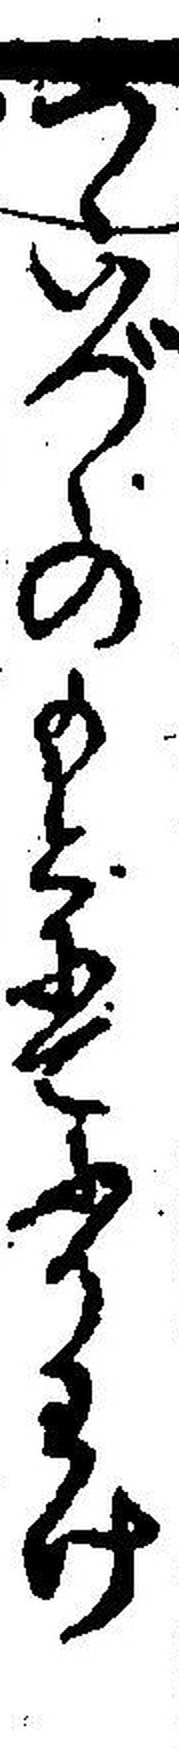つゝいづゝのもとにてふりわけ
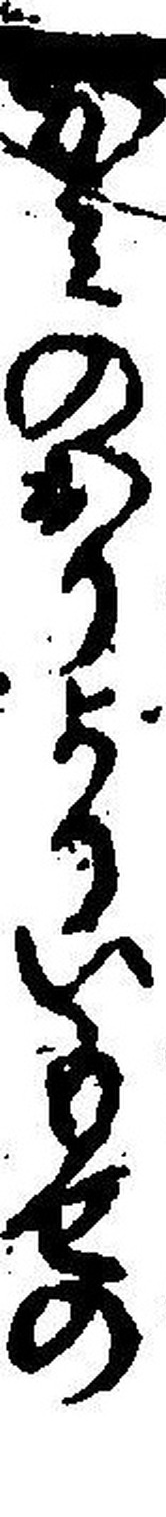かみのおりよりいもせの
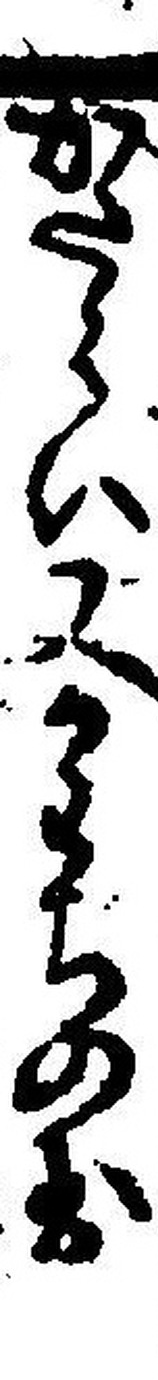かたらい又かわちの国
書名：御代参牛時詣 / 市場通笑作
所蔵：東京大学総合図書館 General Library in the University of Tokyo, JAPAN
